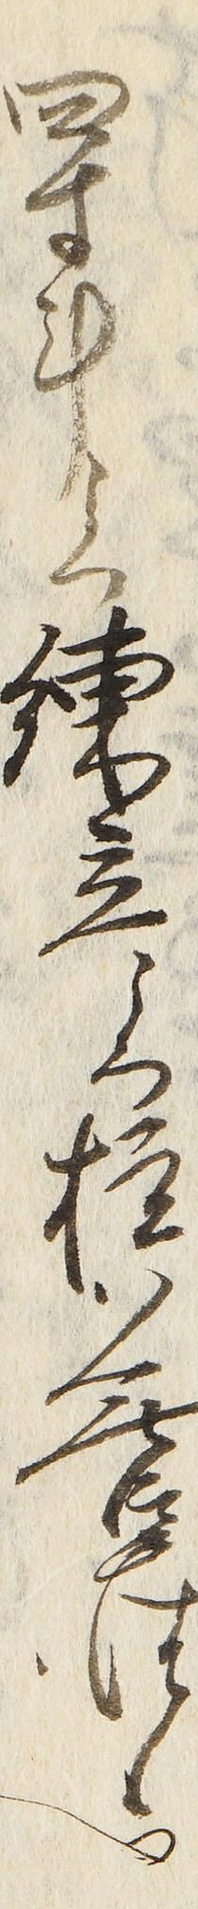四寸計ニ而練立ニ而柱は無御座候
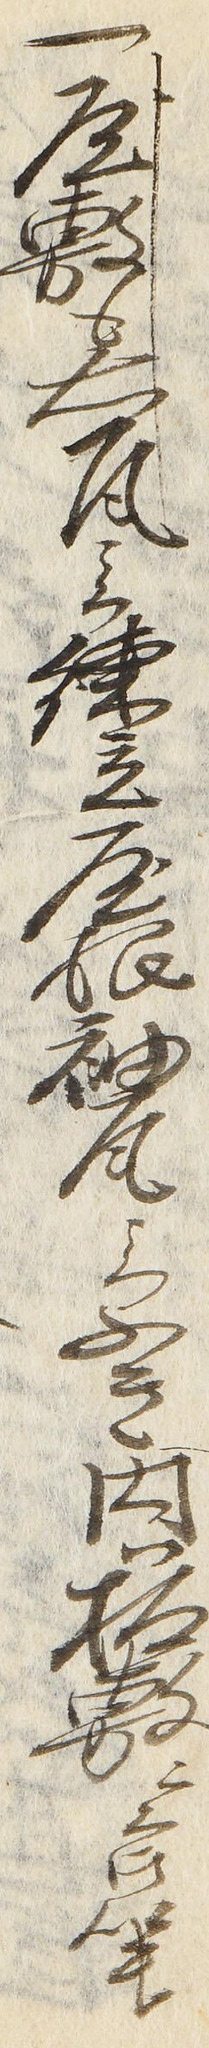一屋敷も右瓦ニ而練立屋根袖瓦ニ而ふき内は板敷ニ而御座候
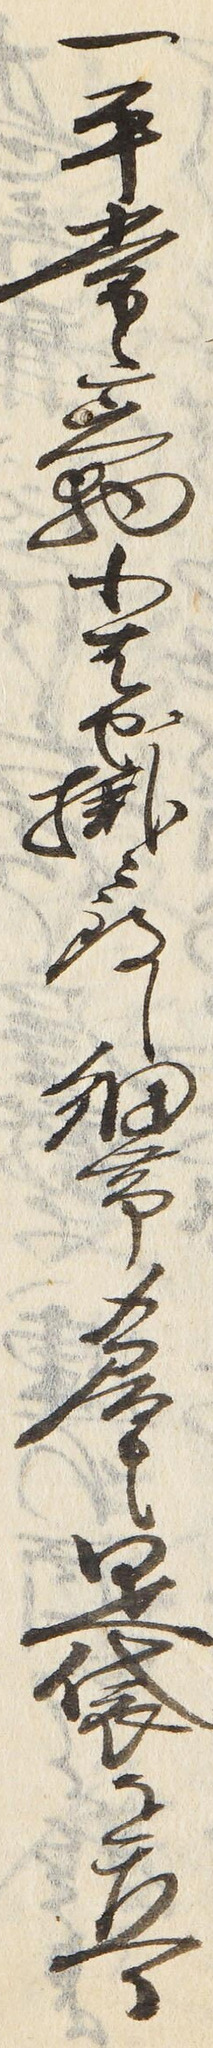一平常之着物小はセ掛ニ致し細帯〆居申候足袋を立て
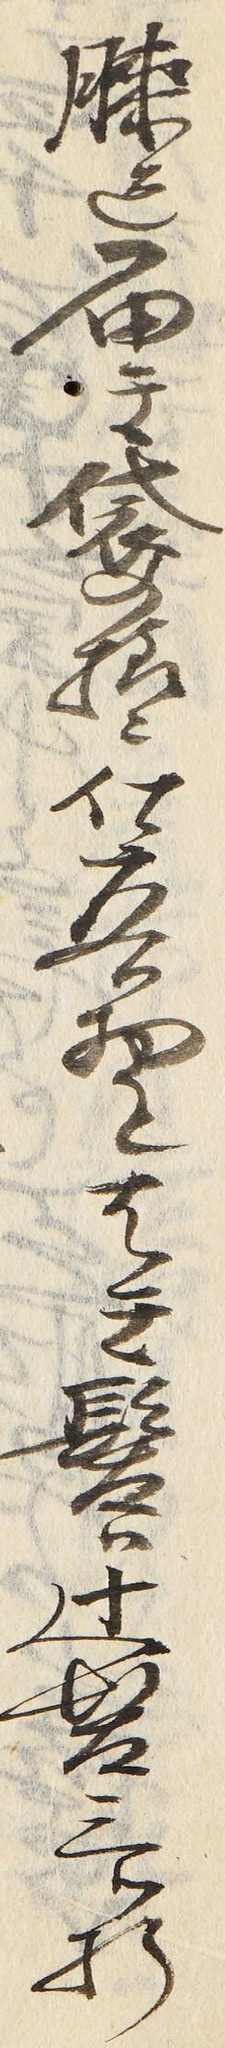膝迄届き袋の様ニ仕立候物をはき髪は辻髪三ッ折
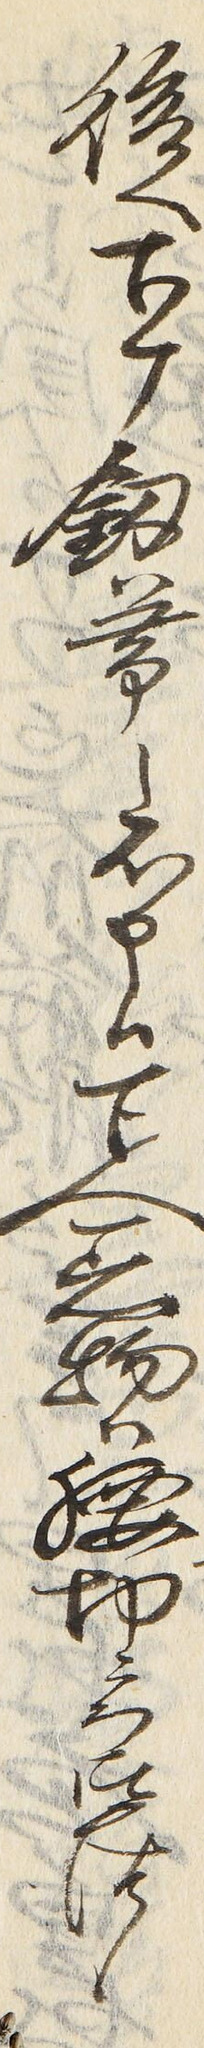後へ下ケ剱帯し不申候下人着物は腰布ニ而御座候
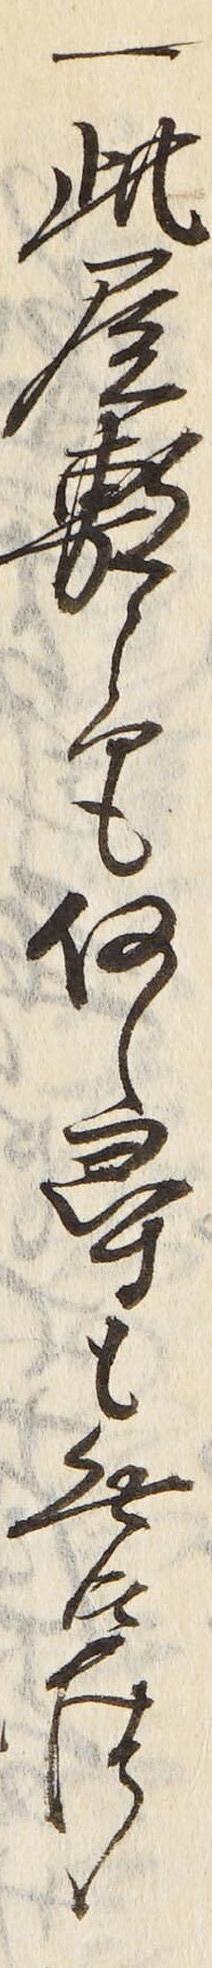一此屋敷ニ而も何之尋も無御座候
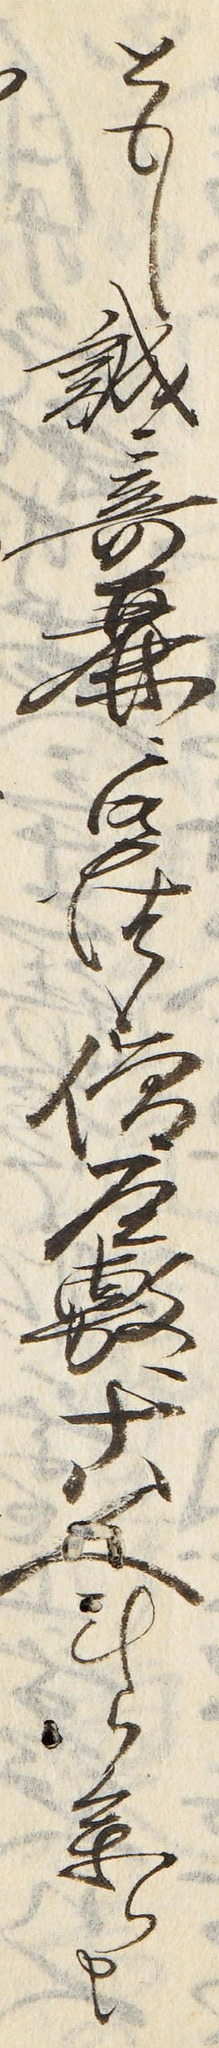ともし誠ニ奇麗ニ御座候僧屋敷へ十八人計り参り申候
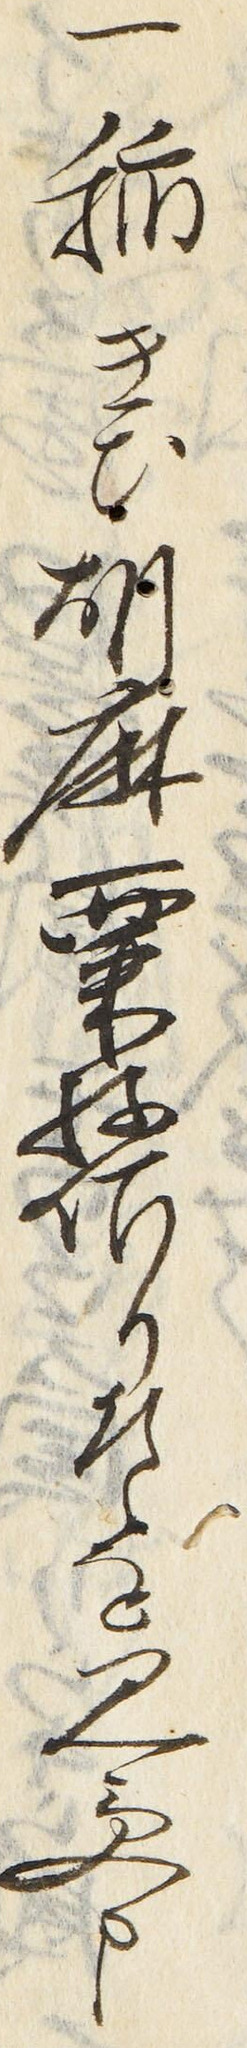一稲きひ胡麻粟抔作り付候を見受申候

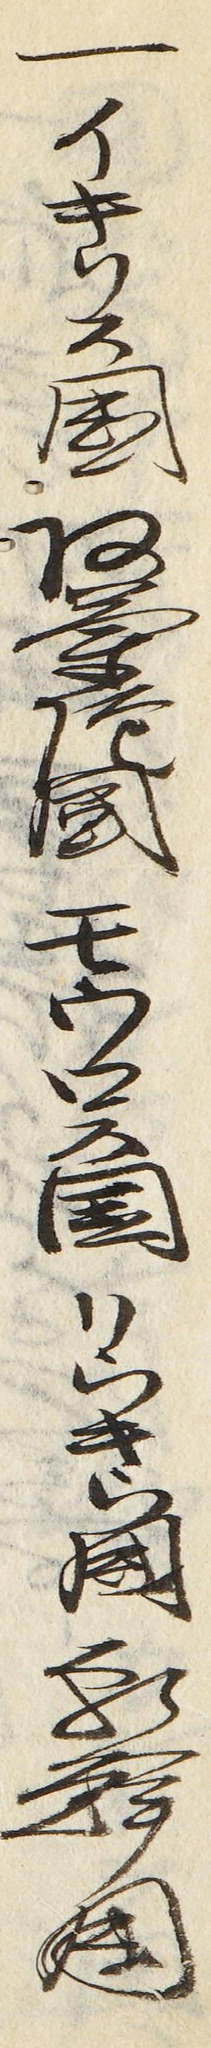一イキリス国阿蘭陀国モウロス国リウキウ国朝鮮国
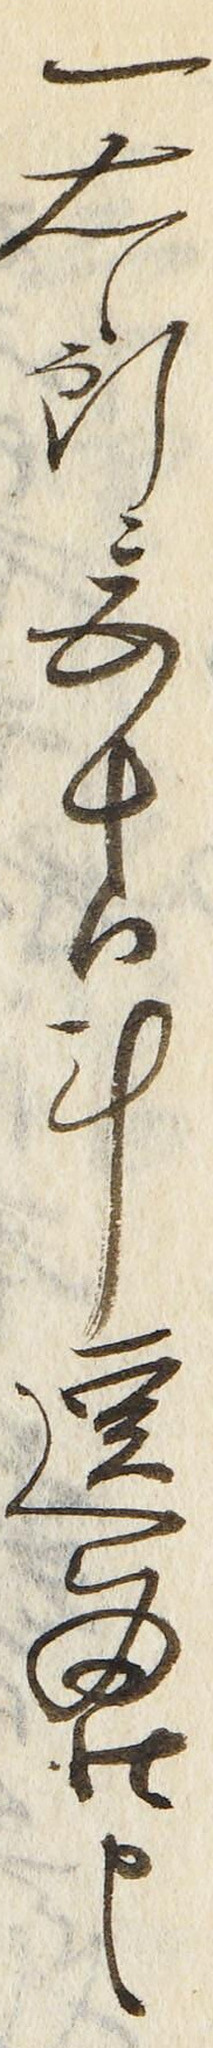一右之所ニ五十日計逗留仕申候
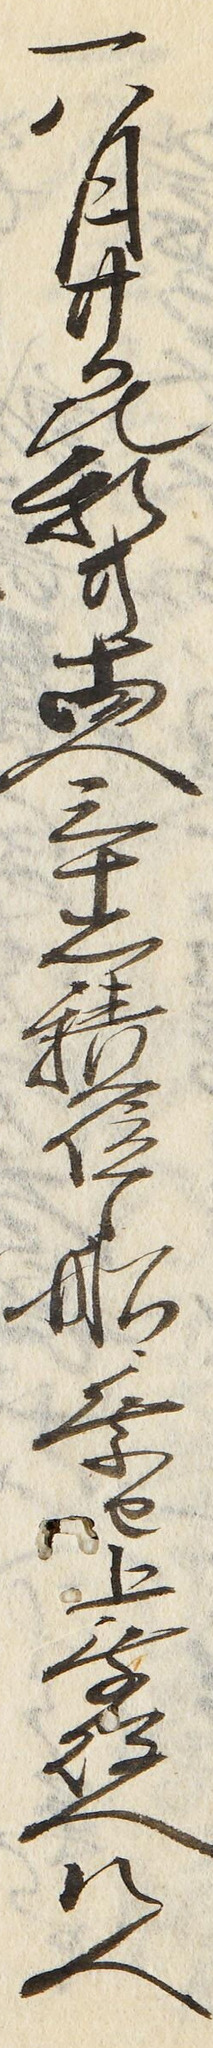一八月廿日頃私共十四人三十石積位之船ニ乗セ上乗役人八人
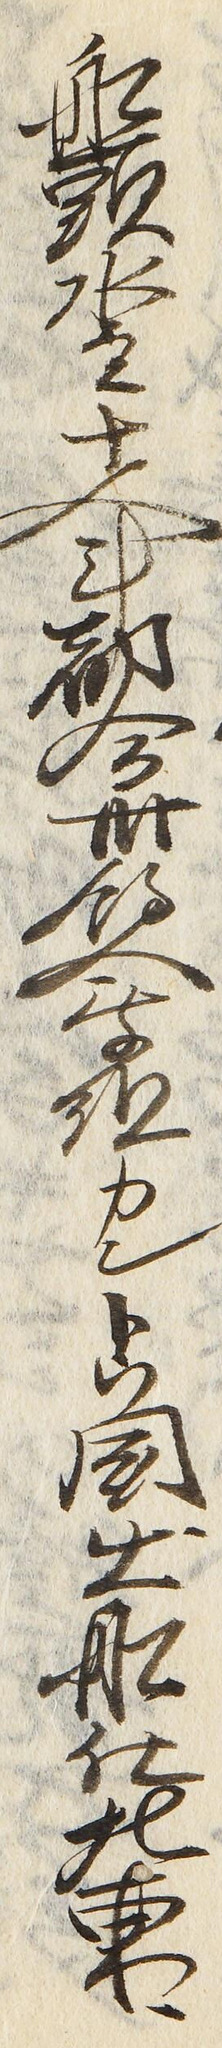船頭水主十人計都合丗餘人乗組カントウ国出船仕北東へ
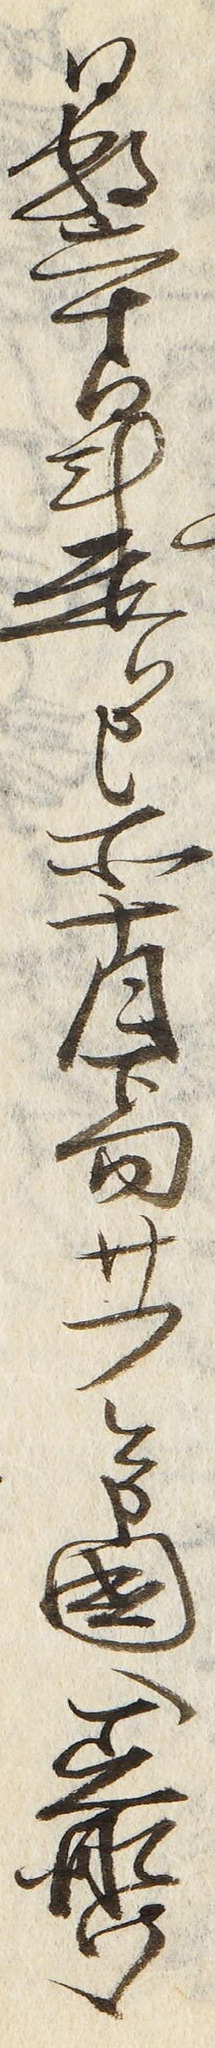日数二十日計走り申候所十月下旬サフと申国へ着船仕候
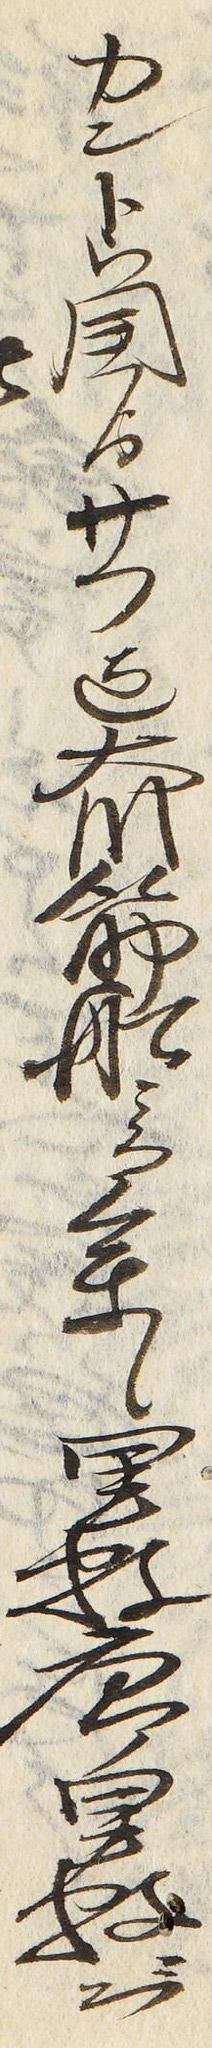カントウ国ゟサフ迄大川筋船ニ而参候里数唐ノ里数ニ而
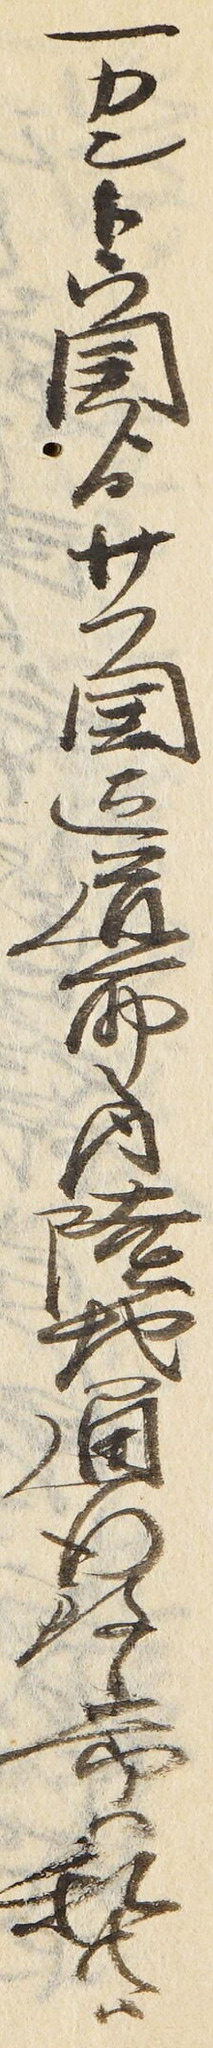一カントウ国ゟサフ国迄道筋之内陸地通行致候節は私共は
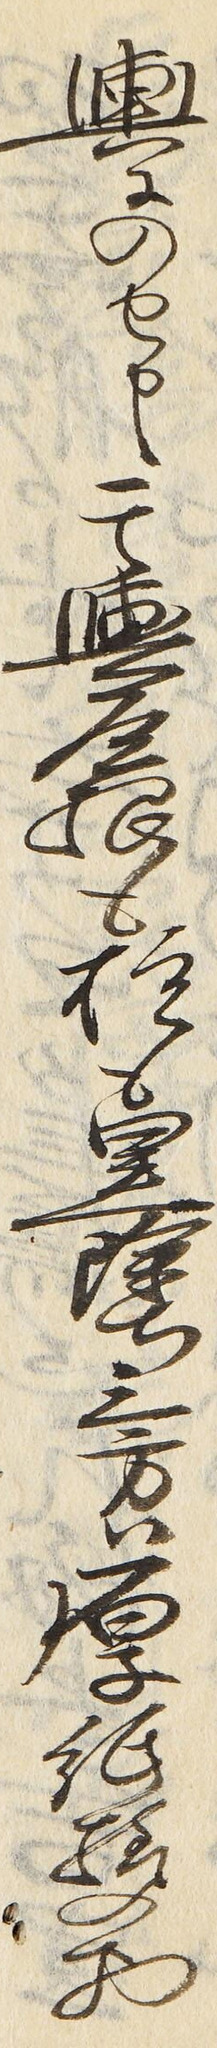輿にのセ申候其輿屋根も柱も黒塗三方は厚紙様の物
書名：漂流記
